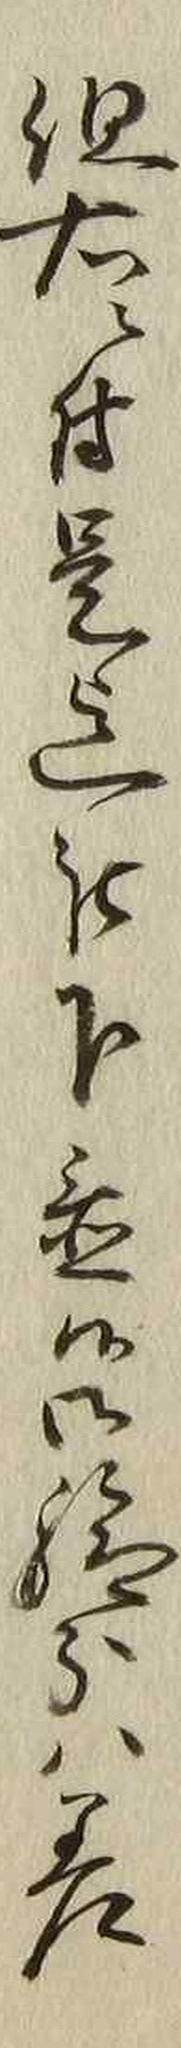但右ニ付是迄被下置候御給分ハ差
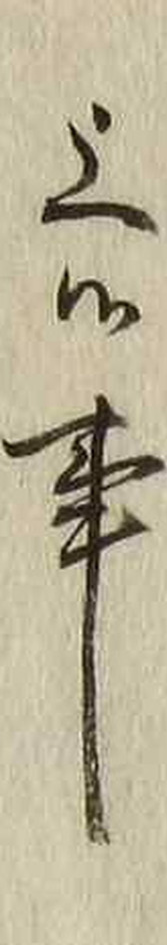上候事
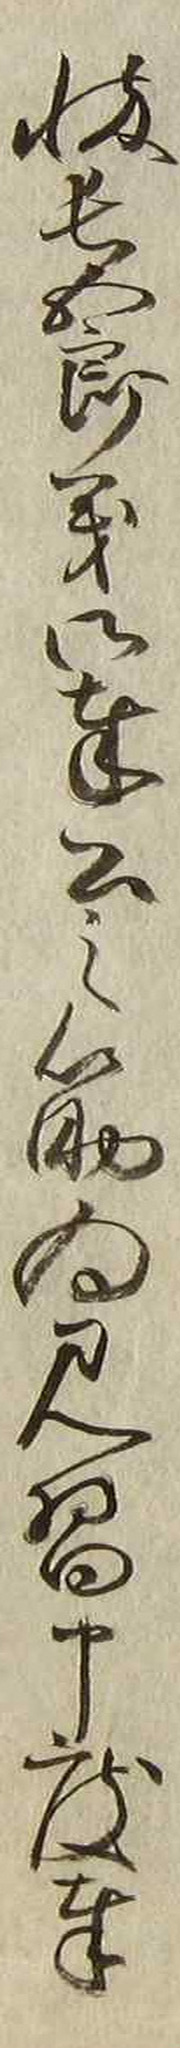忰長五郎義御奉公之筋為見習申度奉
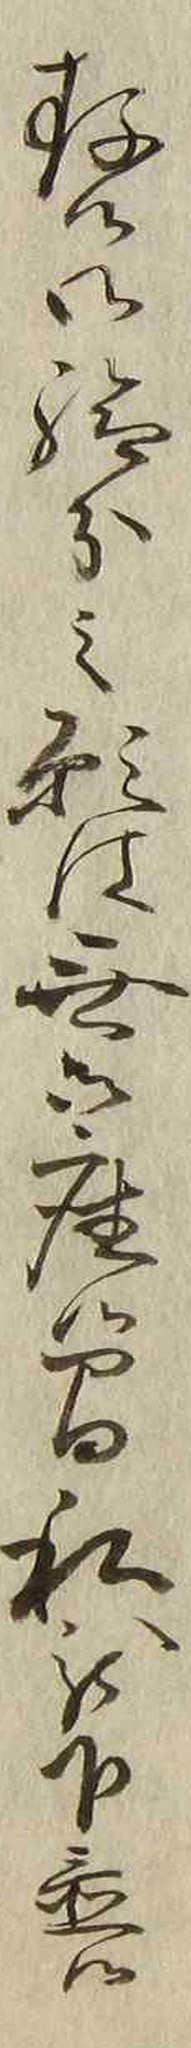存候御給分之願は無御座候間私へ被下置候
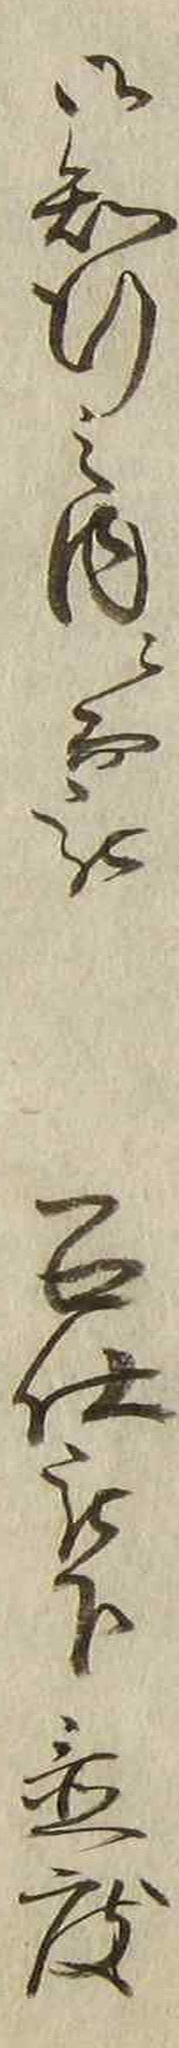御知行之内ニ而被召仕被下置度
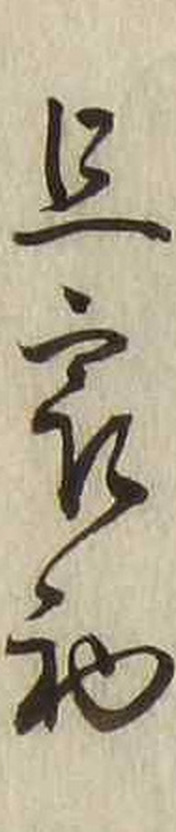且最初

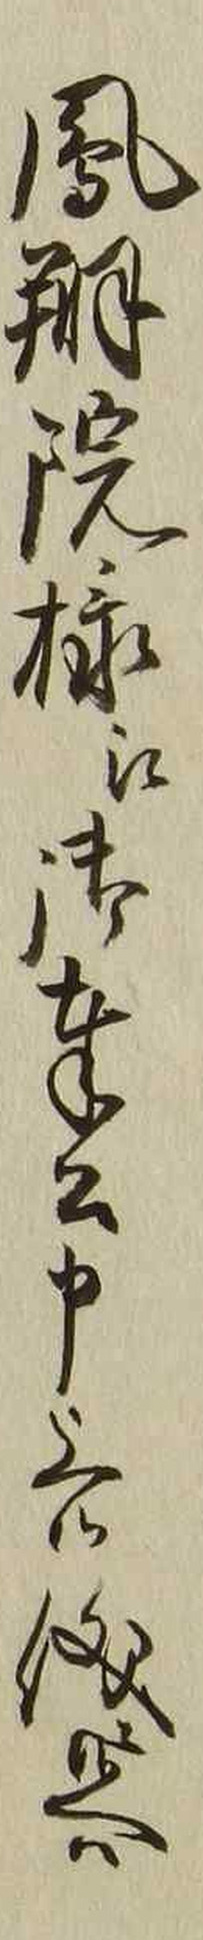鳳翔院様江御奉公申上候儀ニ候へハ
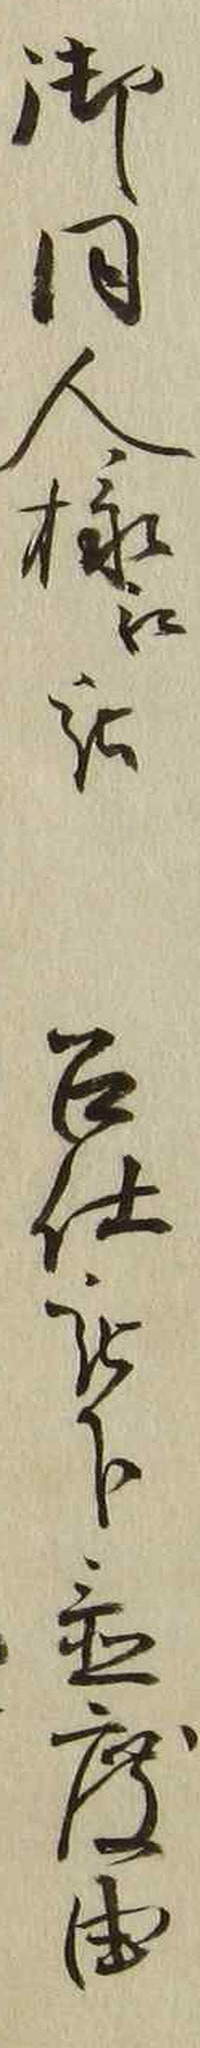御同人様江被召仕被下置度由
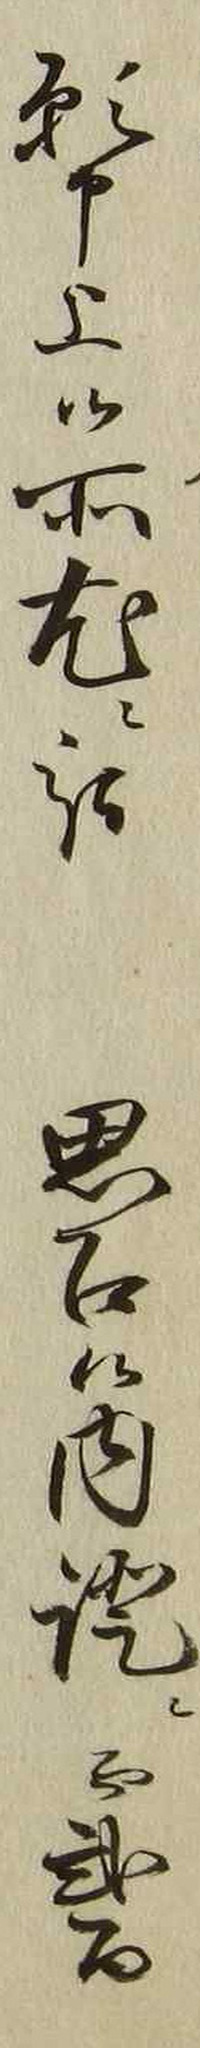願申上候所尤ニ被思召候内証ニ而弐百
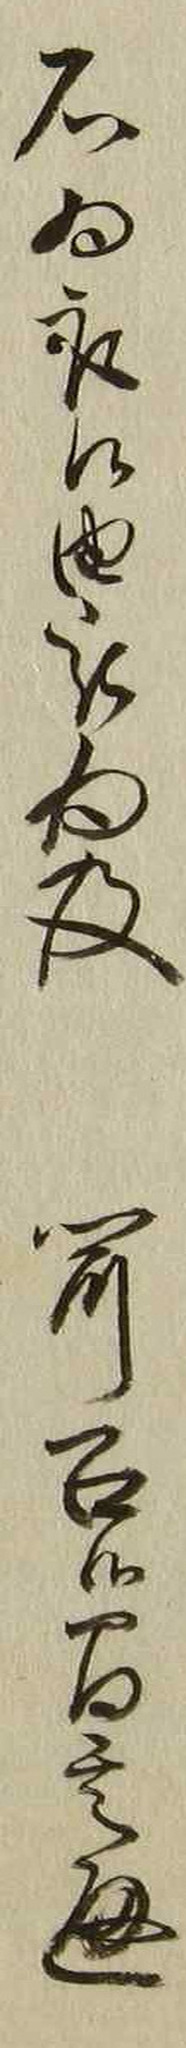石為取候由被為及聞召候間其通
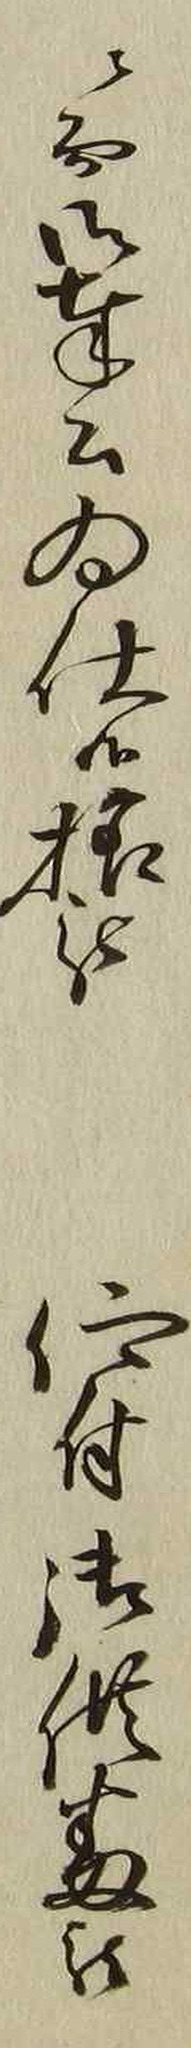ニ而御奉公為仕候様被仰付御供番被
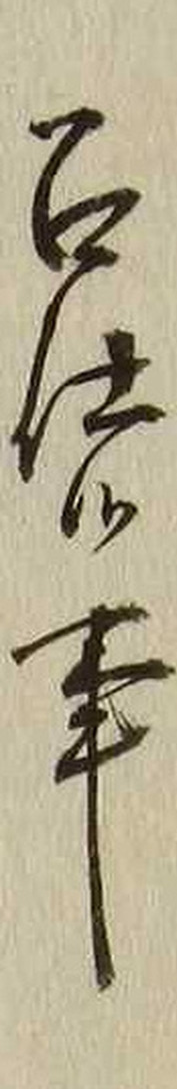召仕候事
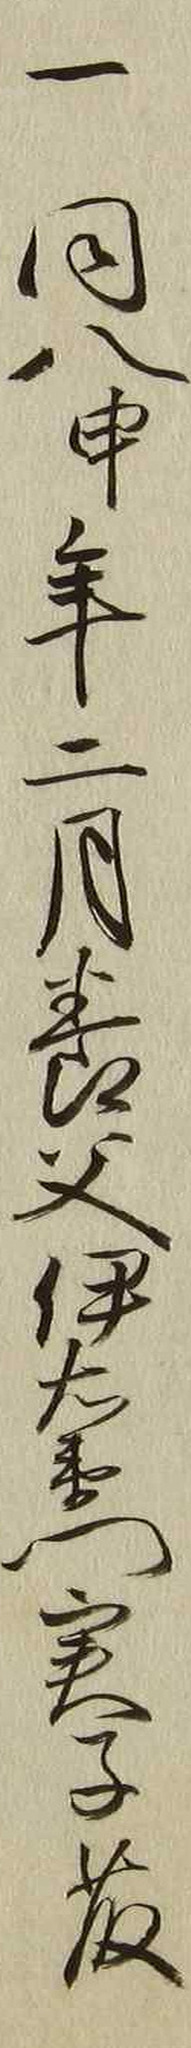一同八申年二月養父伊右衛門実子藤
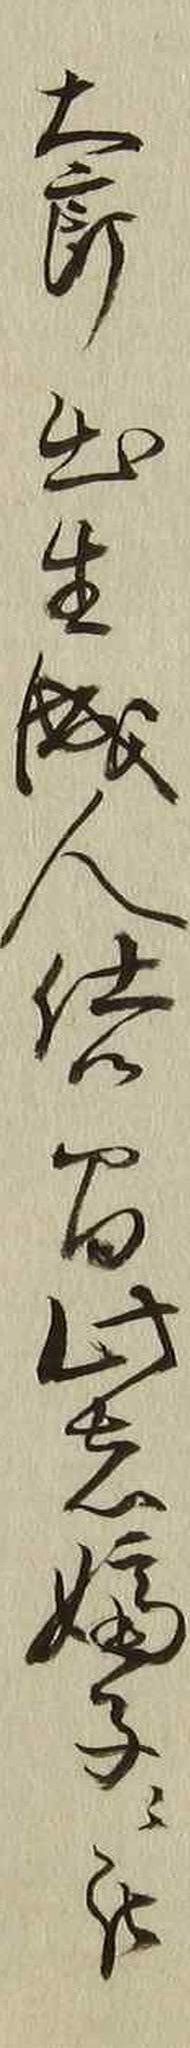太郎出生成人仕候間此者嫡子ニ被
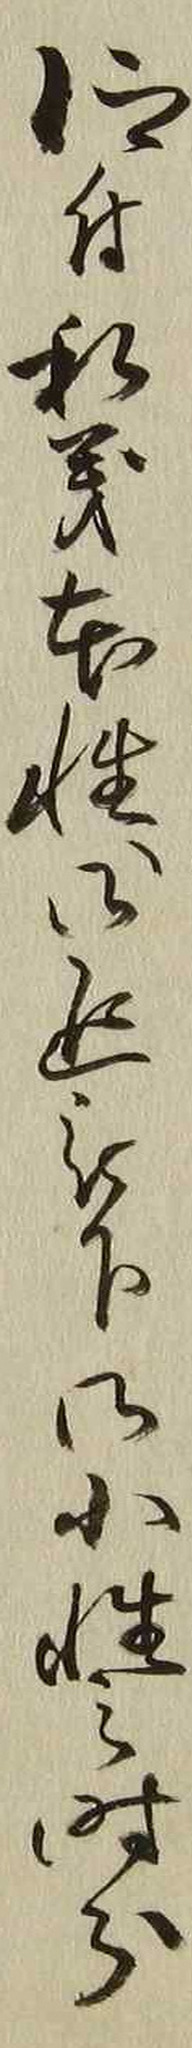仰付私義本性へ御返被下御小性之時分
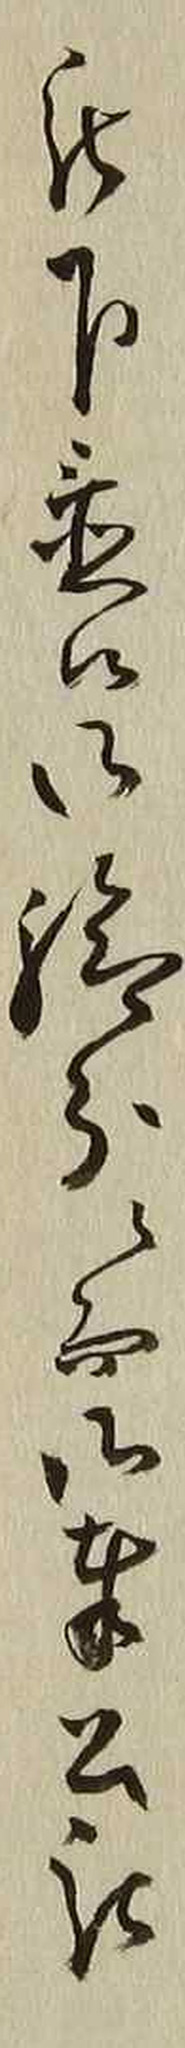被下置候御給分ニ而御奉公被
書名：諸士系譜　巻之60　と之部3
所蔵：会津若松市立会津図書館
